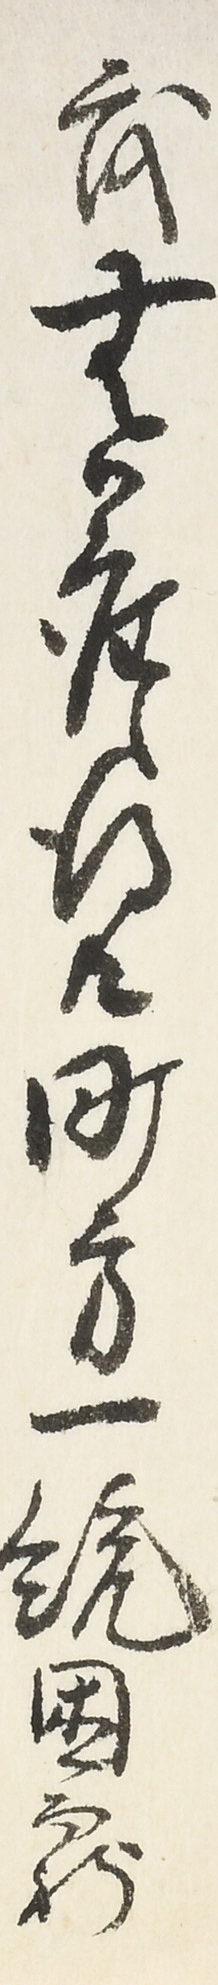も無御座候得共町方一統困窮
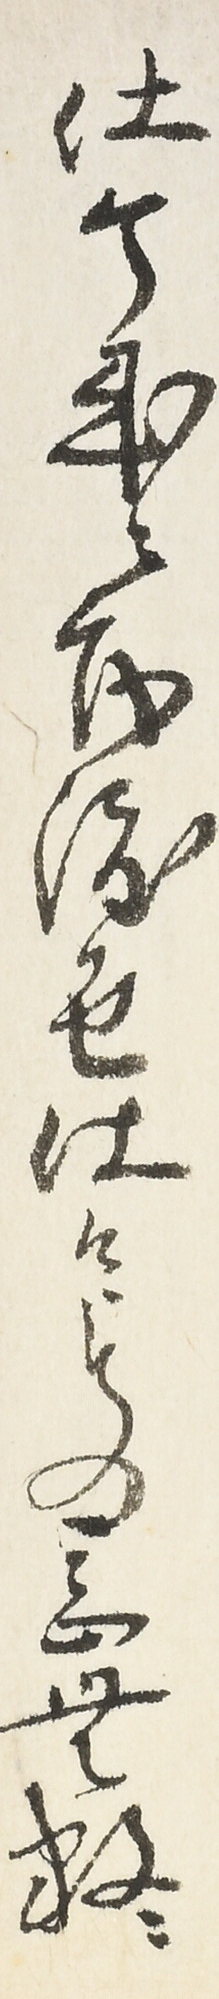仕ケ成ニも渡世仕候もの甚無救ニ
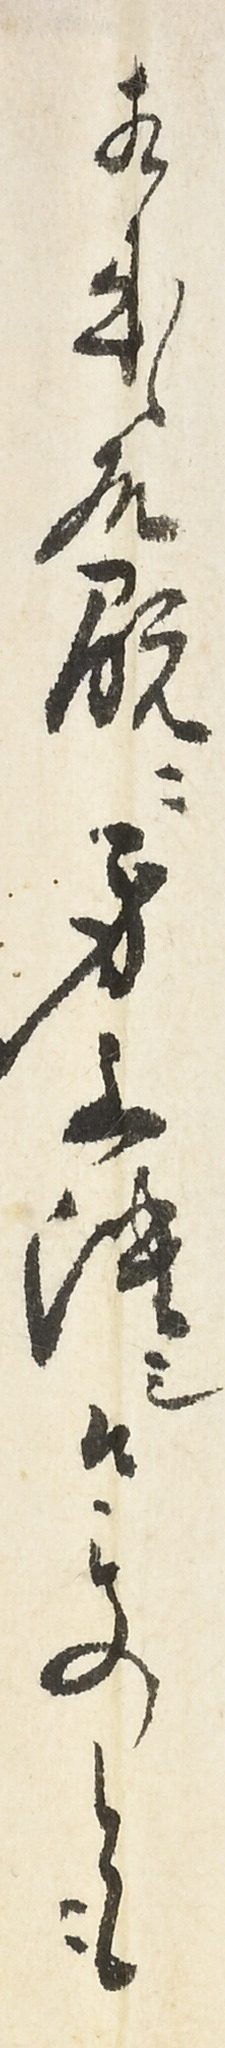相成候故既ニ身上潰シ候ものとも
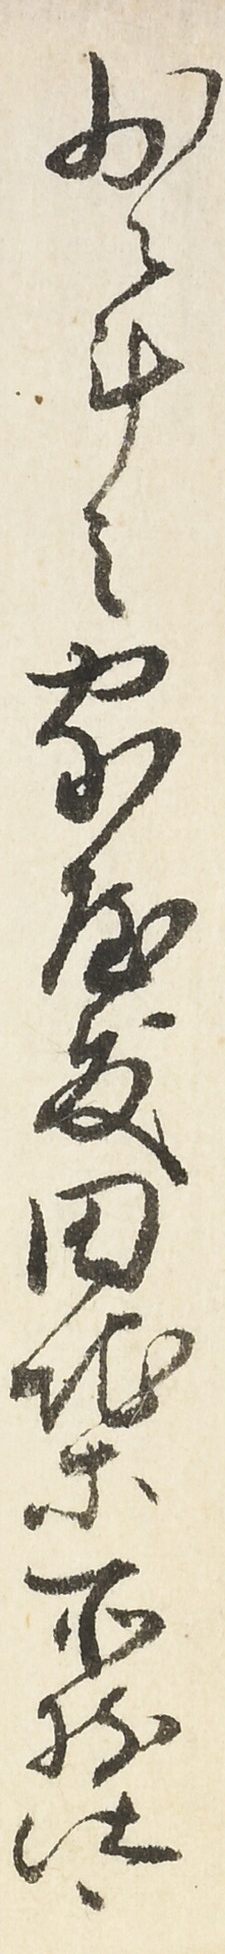少々計之家屋敷田地等所持仕候
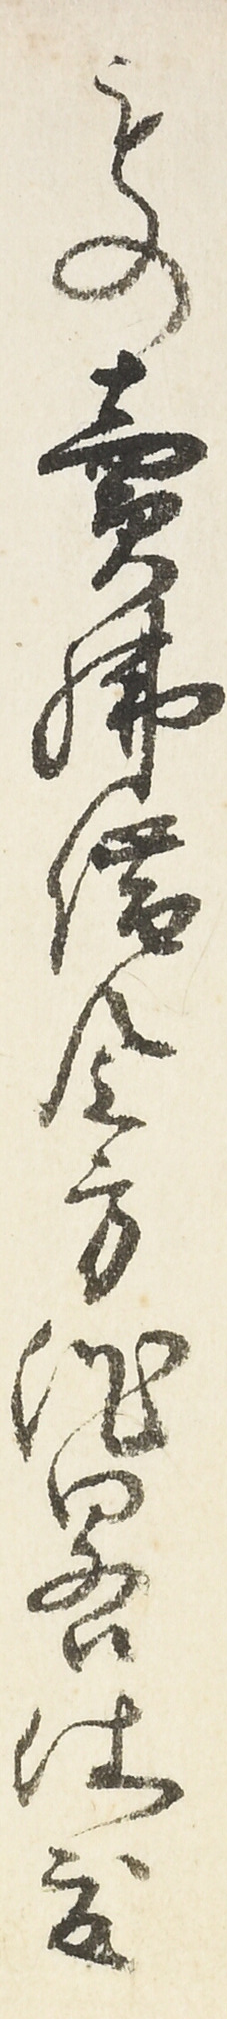もの売払借金方作写ハ仕度
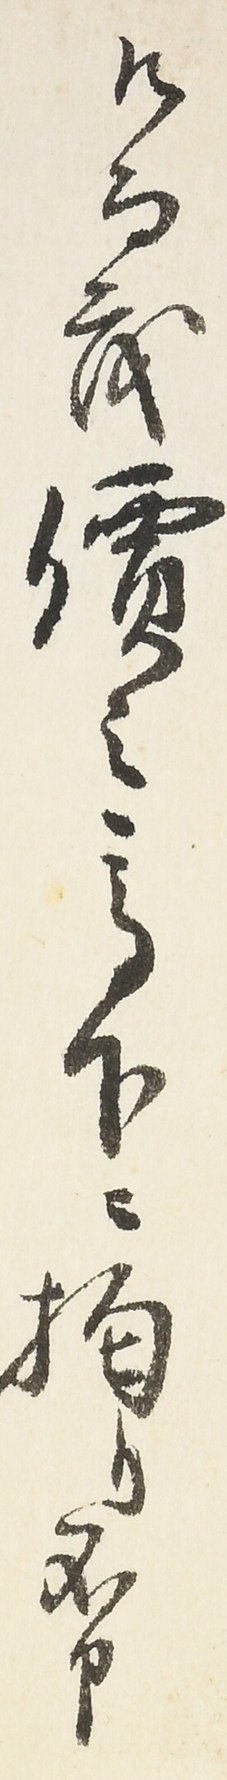候而も価之高下ニ拘り不申
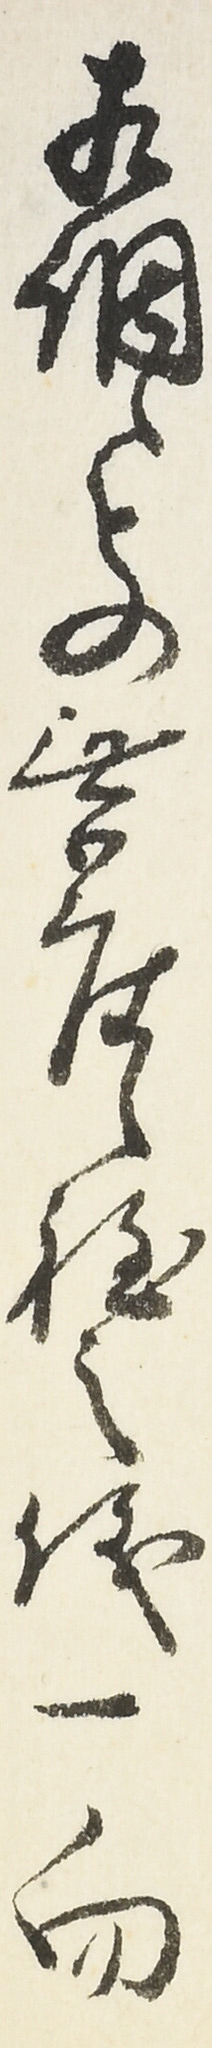相調候もの村御座候程之儀一向
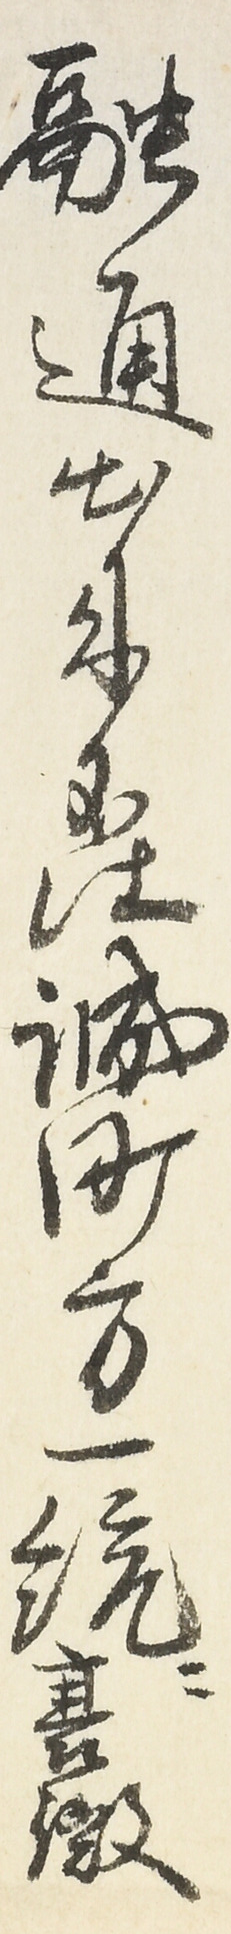融通出来不仕誠町方一統ニ衰微
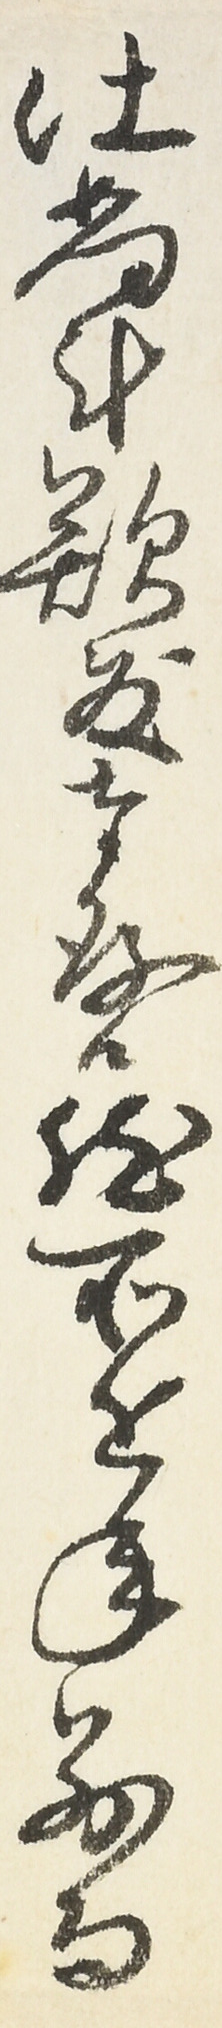仕如何計歎敷奉存候然所近年別而
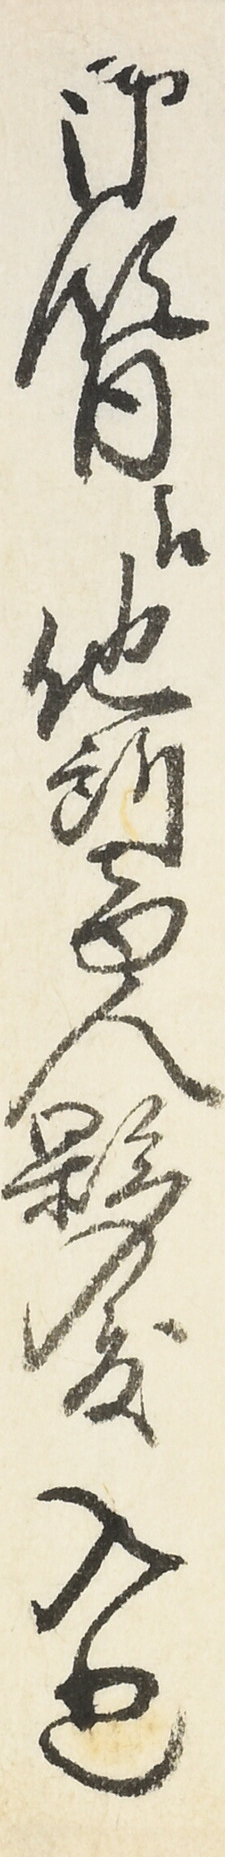御領内江他所商人夥敷入込
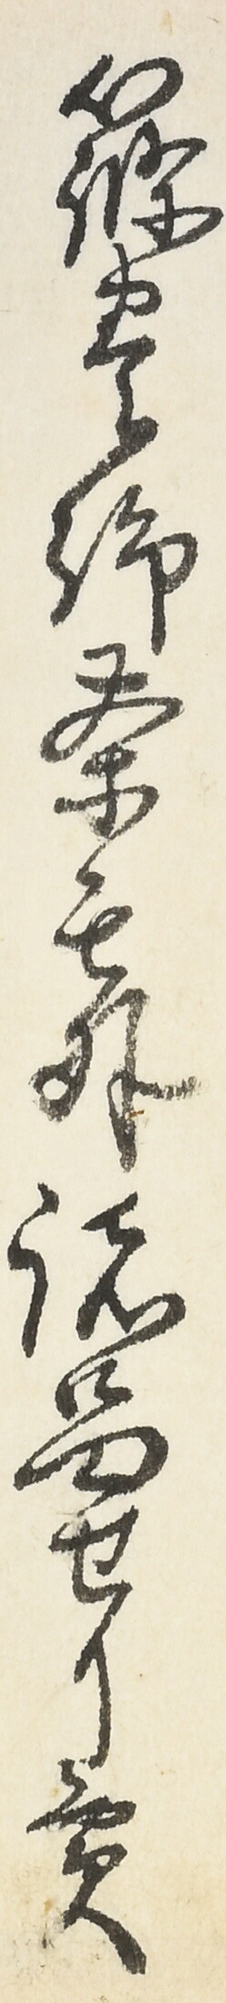篠豊御祭其外諸品せり売
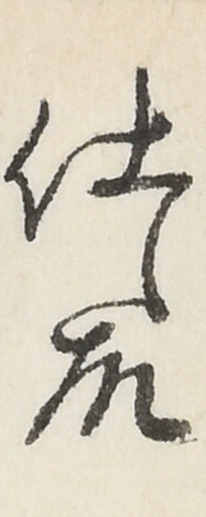仕候故
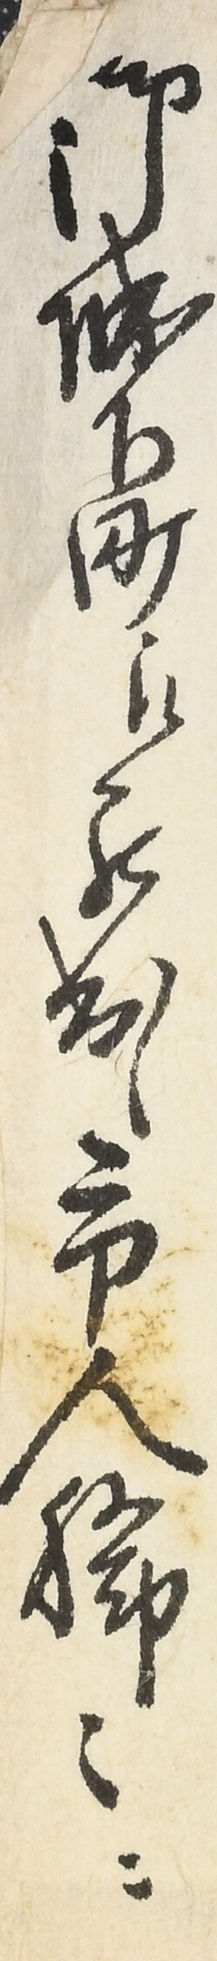御城下町江罷出候市人脚々ニ
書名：乍恐以口上書奉願上候御事
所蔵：伊那市立高遠町図書館・合同会社AMANE
